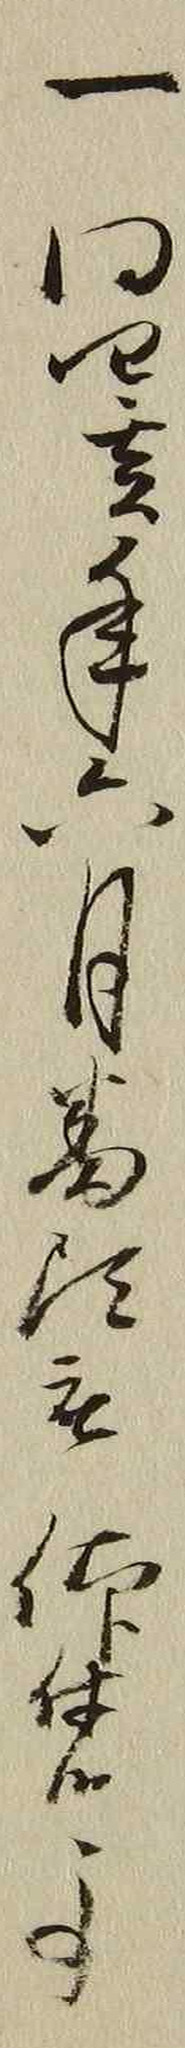一同四亥年六月番頭被仰付候事
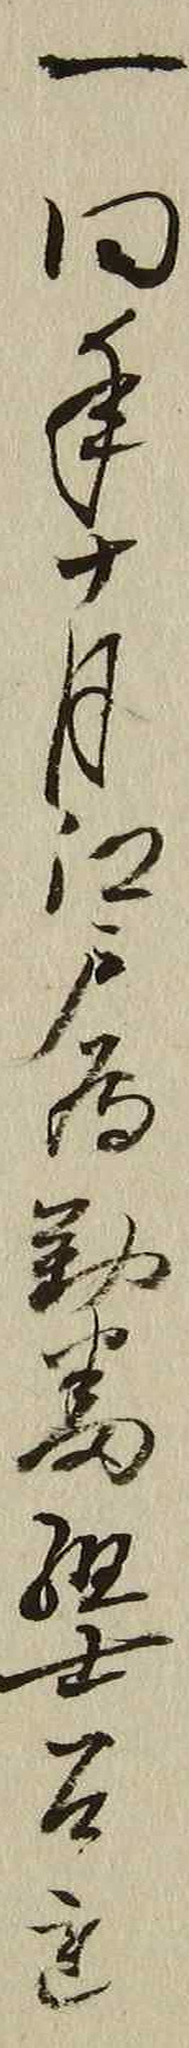一同年十月江戸為勤番組士召連
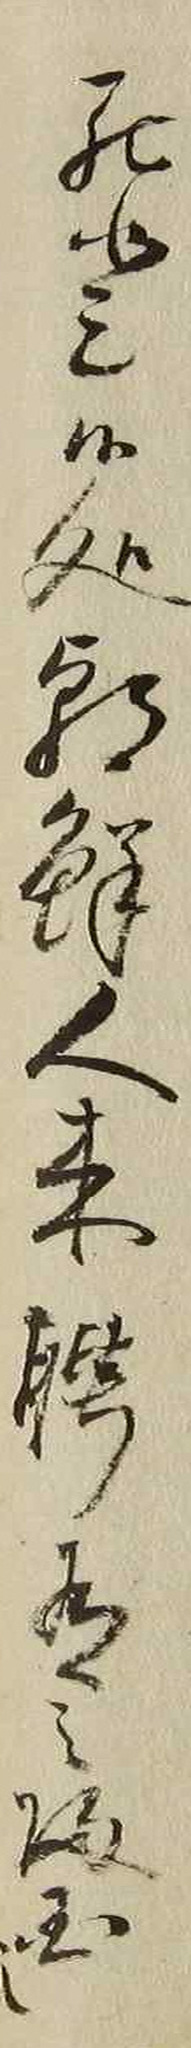罷登候処朝鮮人来聘有之帰国之
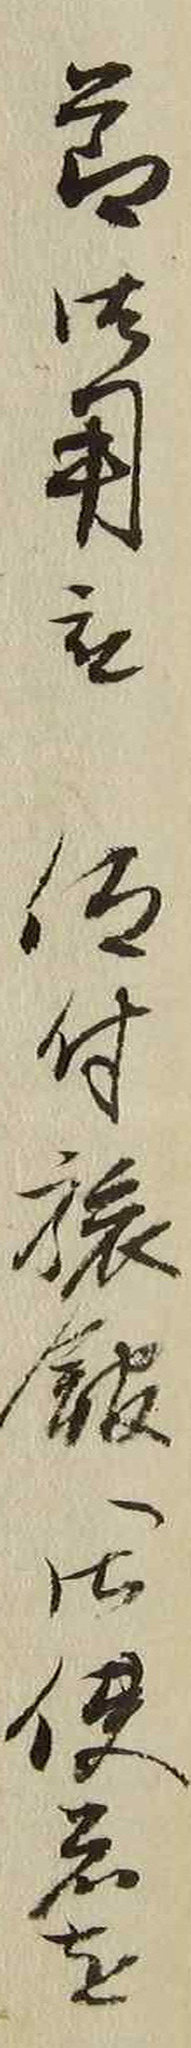節御用被仰付旅館へ御使者を
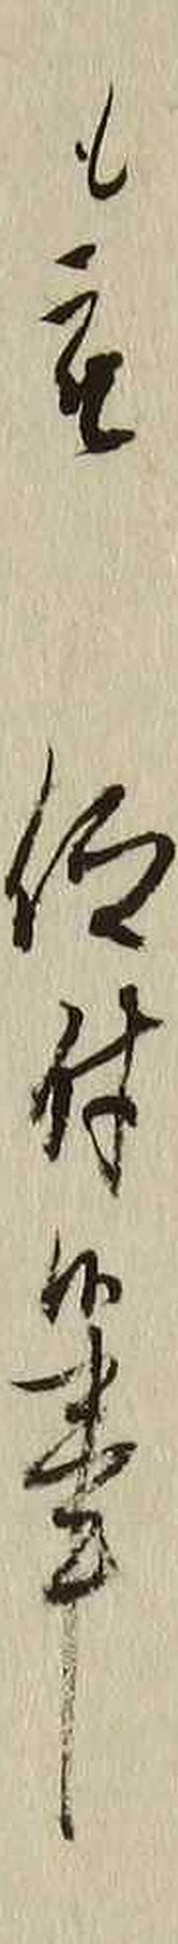も被仰付候事
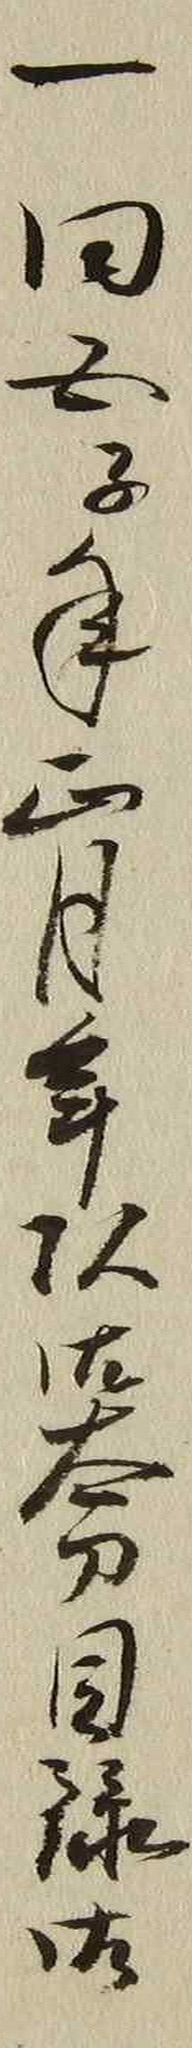一同五子年正月年頭御太刀目録御
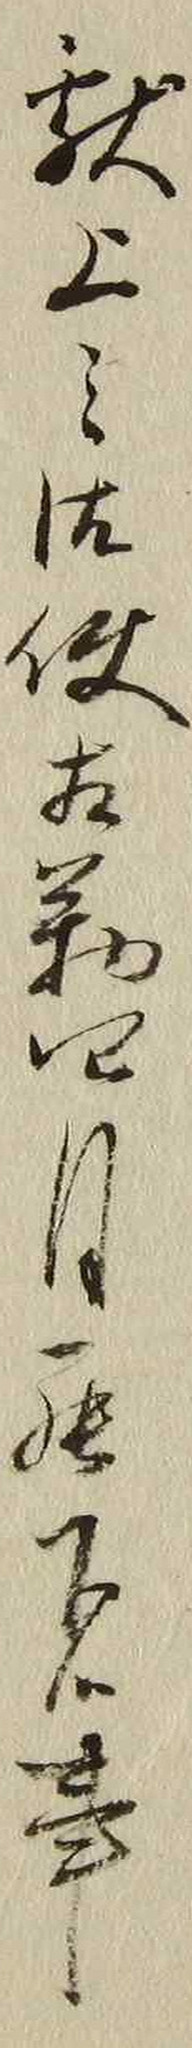献上之御使相勤四月罷下候事
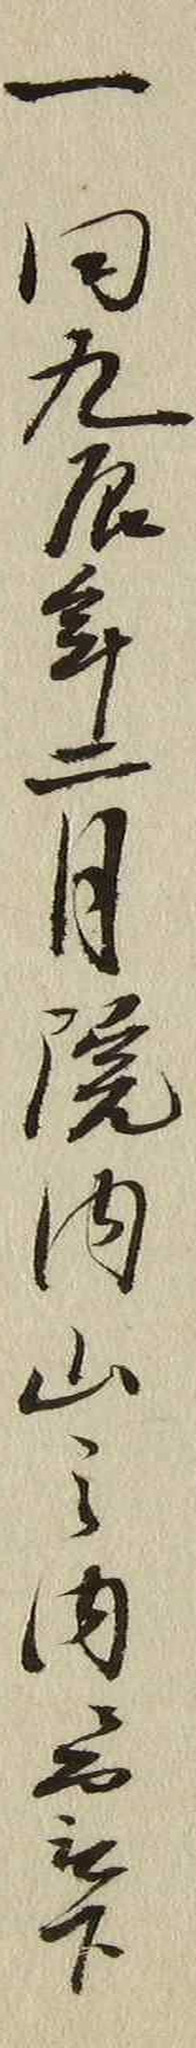一同九辰年二月院内山之内ニ而被下
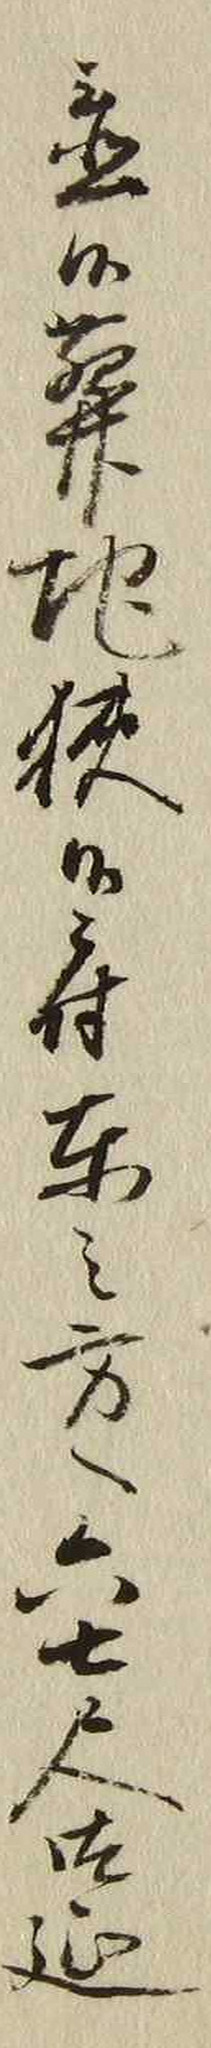置候葬地狭候ニ付東之方へ六七尺御延
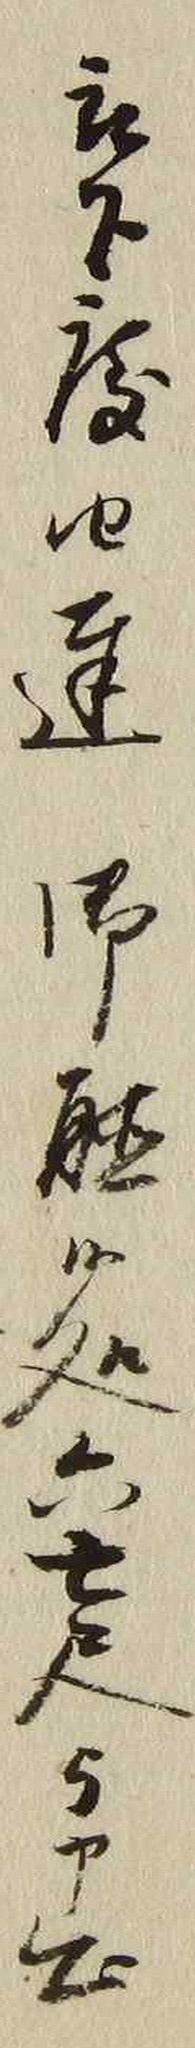被下度由達御聴候処六七尺与申出
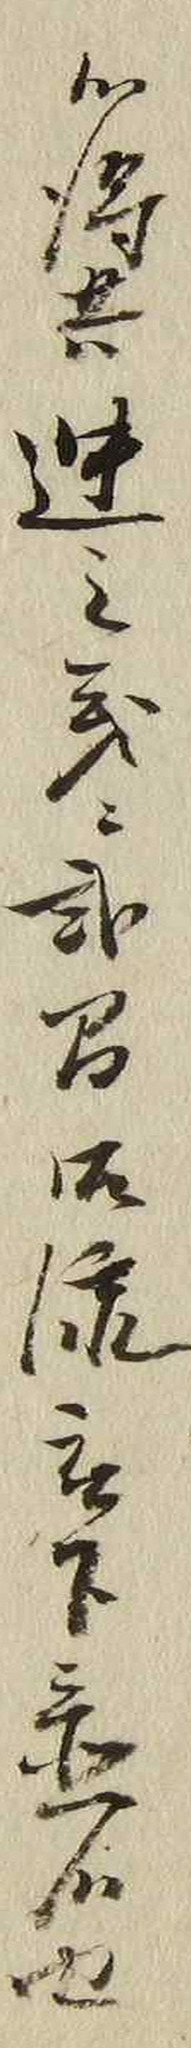候得共迚之義ニ弐間御添被下置候由
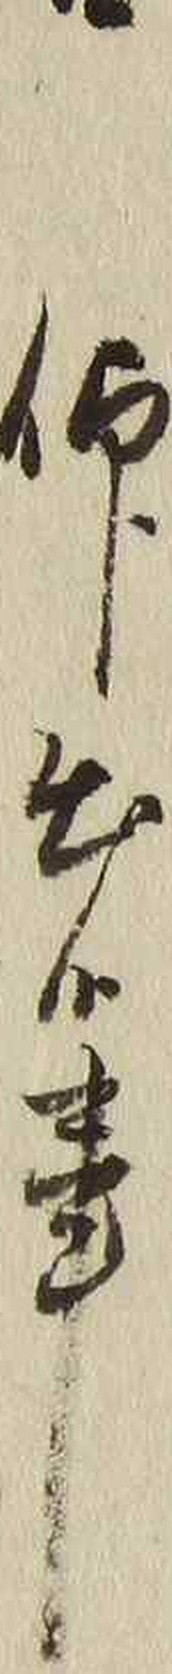被仰出候事
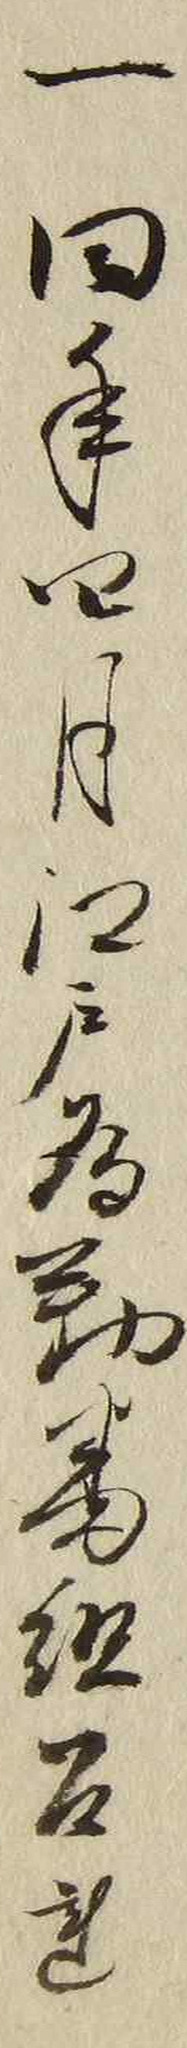一同年四月江戸為勤番組召連

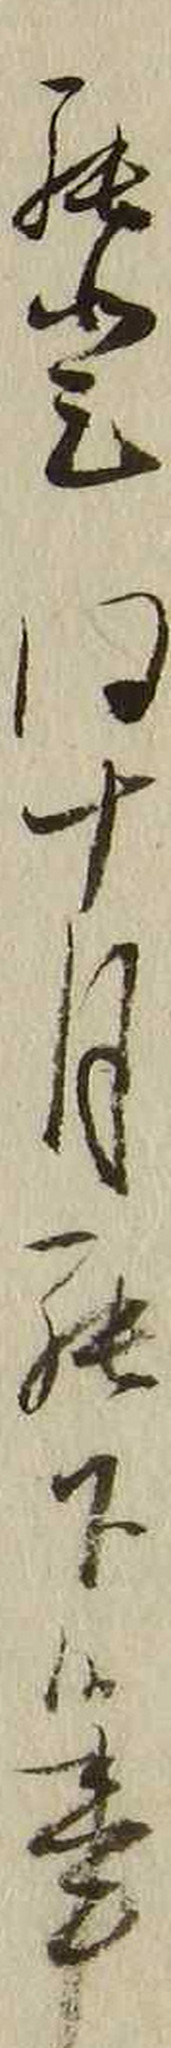罷登同十月罷下候事
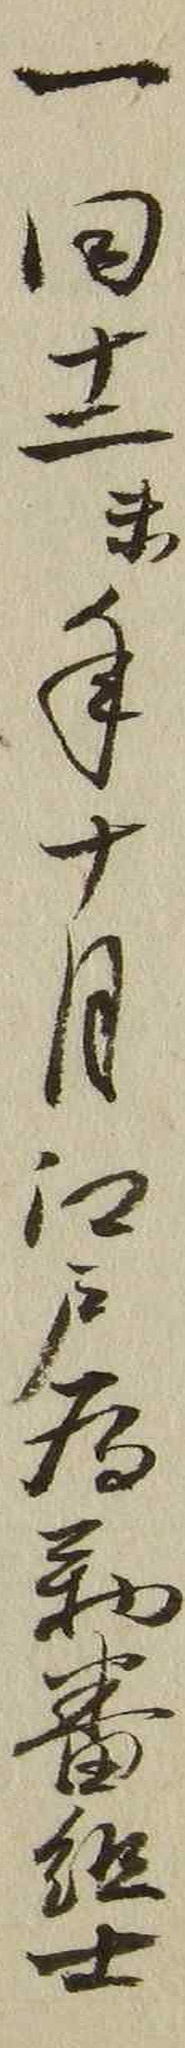一同十二未年十月江戸為勤番組士
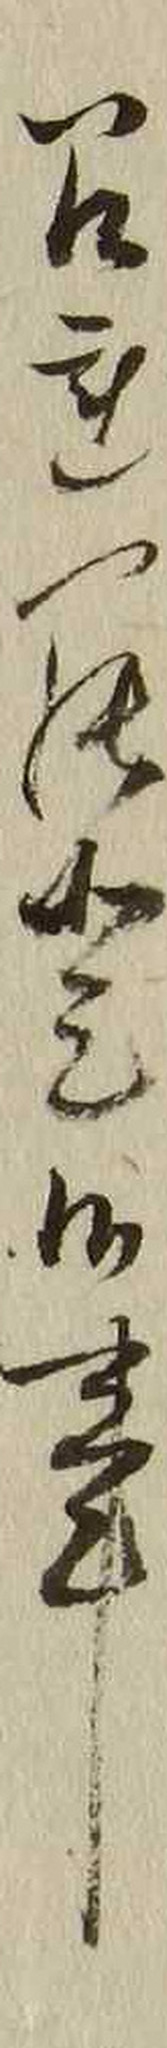召連罷登候事
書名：諸士系譜　巻之351　す之部1
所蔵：会津若松市立会津図書館
